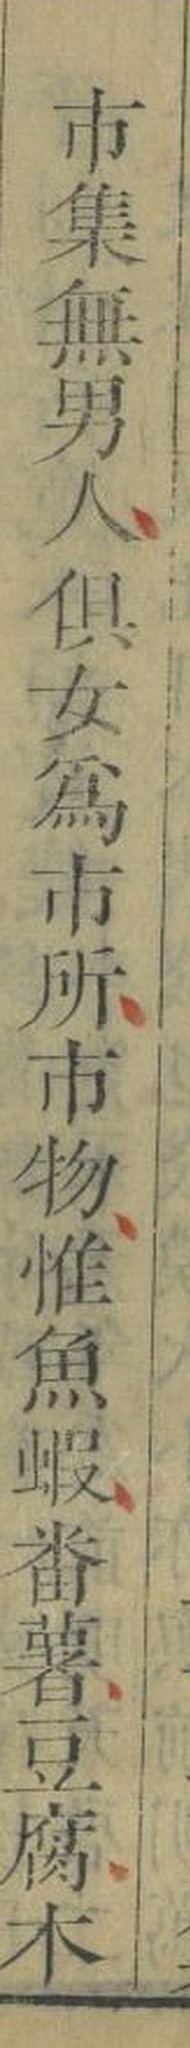市集無男人俱女為市所市物惟魚蝦畨薯豆腐木
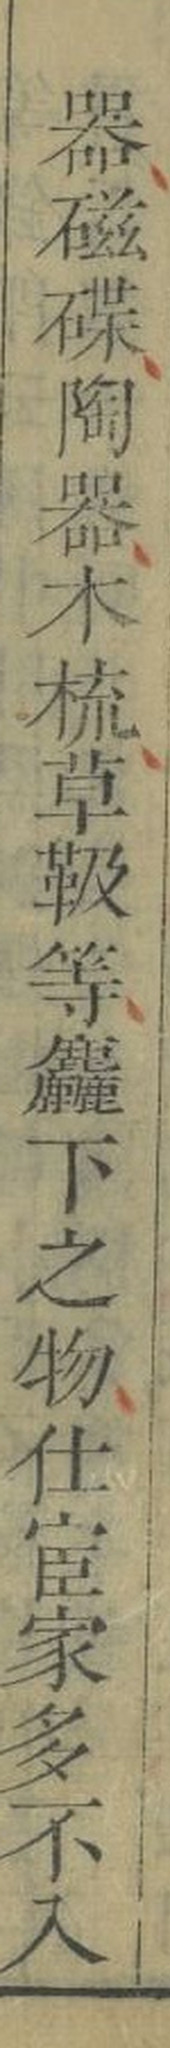器磁碟陶器木梳草靸等麤下之物仕宦家多不入

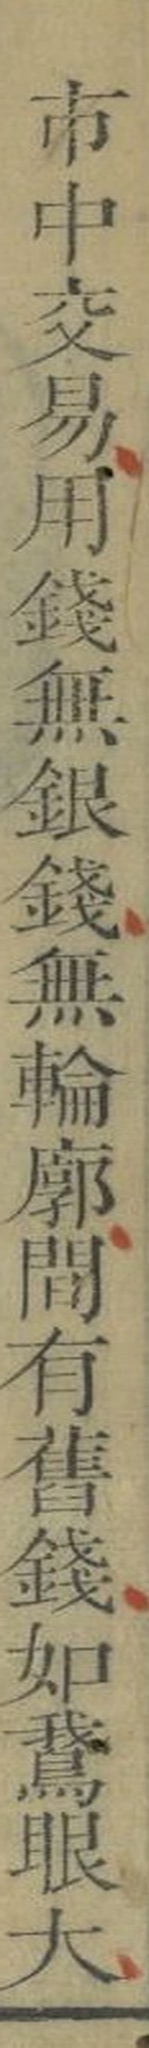市中交易用銭無銀銭無輪廓間有旧銭如鵞眼大
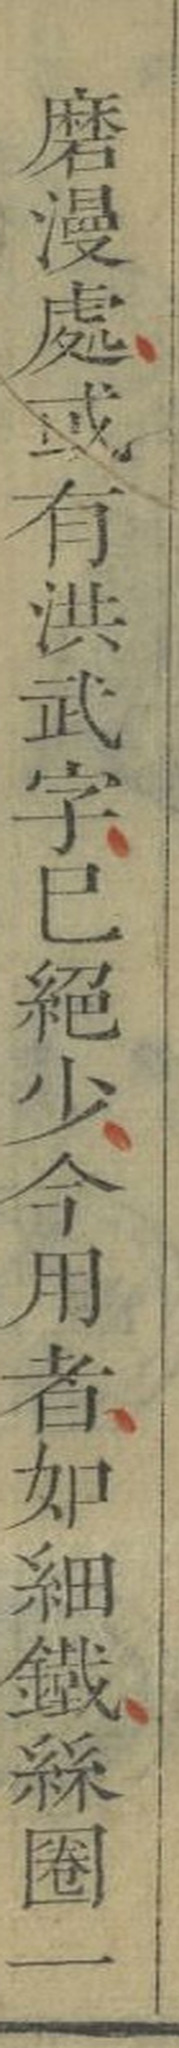磨漫処或有洪武字巳絶少今用者如細鉄糸圏一
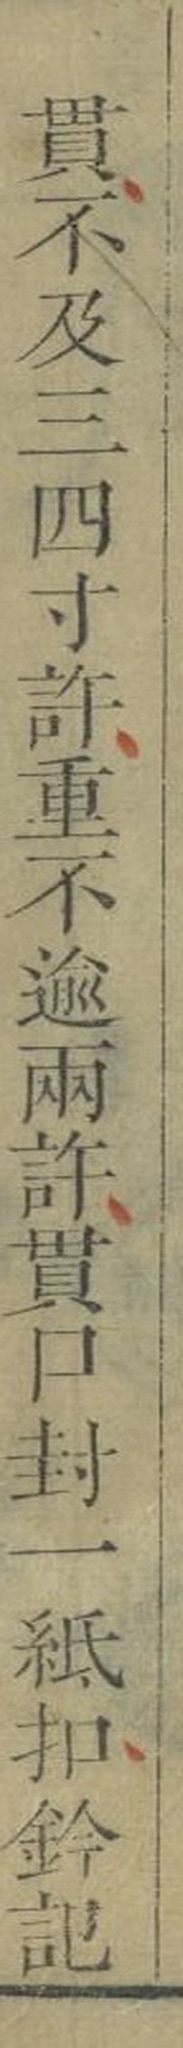貫不及三四寸許重不逾両許貫口封一紙扣鈴記
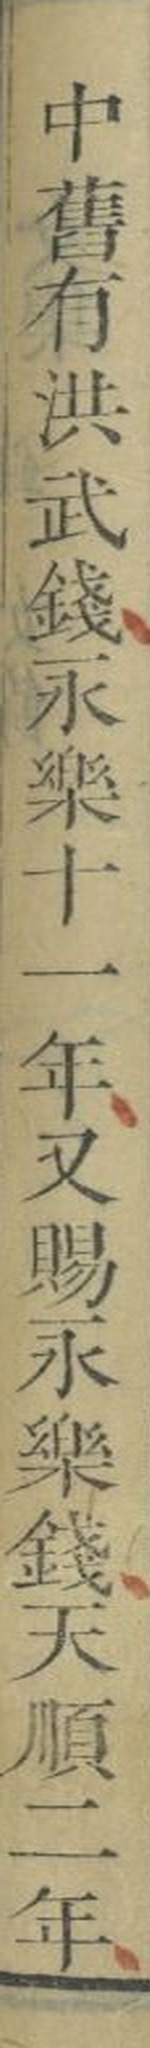中旧有洪武銭永楽十一年又賜永楽銭天順二年
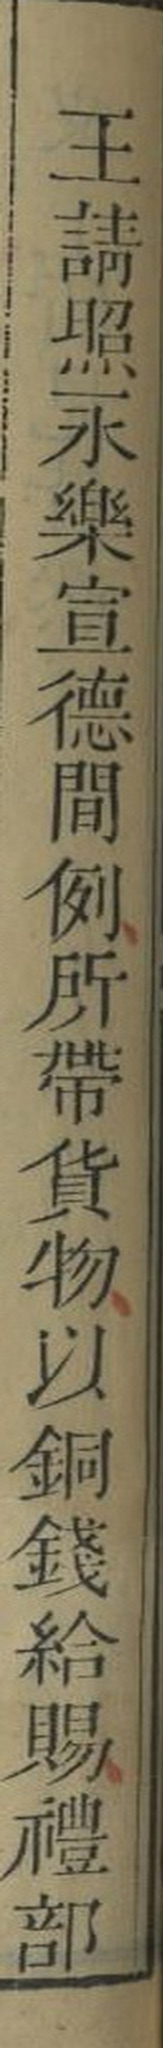王請照永楽宣徳間例所帯貨物以銅銭給賜礼部
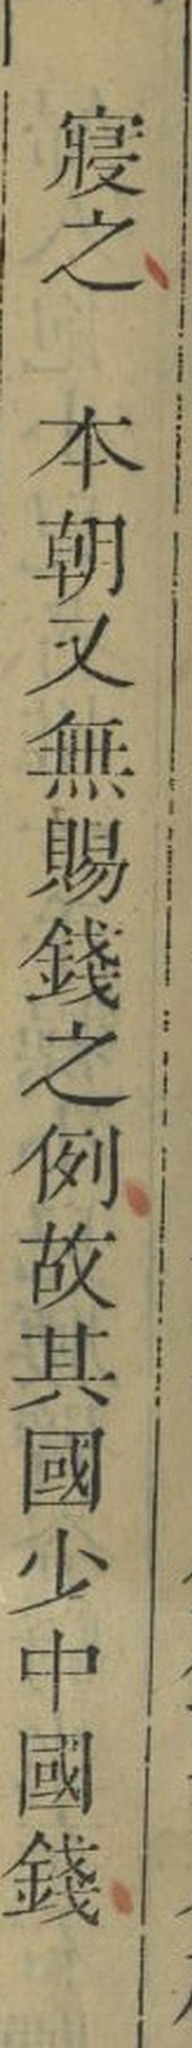寝之本朝又無賜銭之例故其国少中国銭
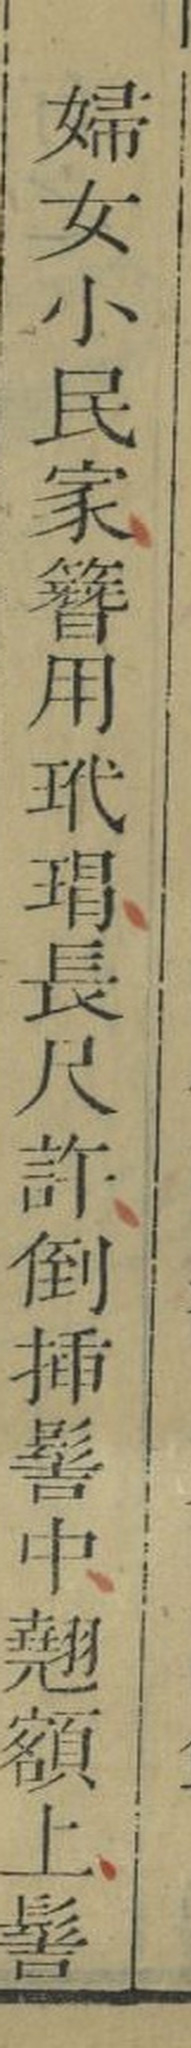婦女小民家簪用玳瑁長尺許倒揷髻中翹額上髻
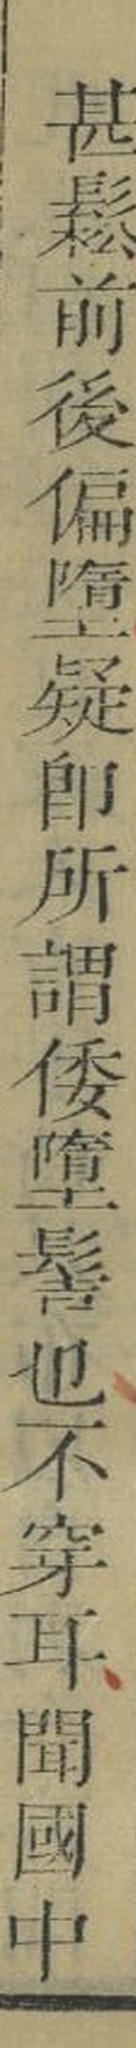甚鬆前後偏堕疑即所謂倭堕髻也不穿耳聞国中
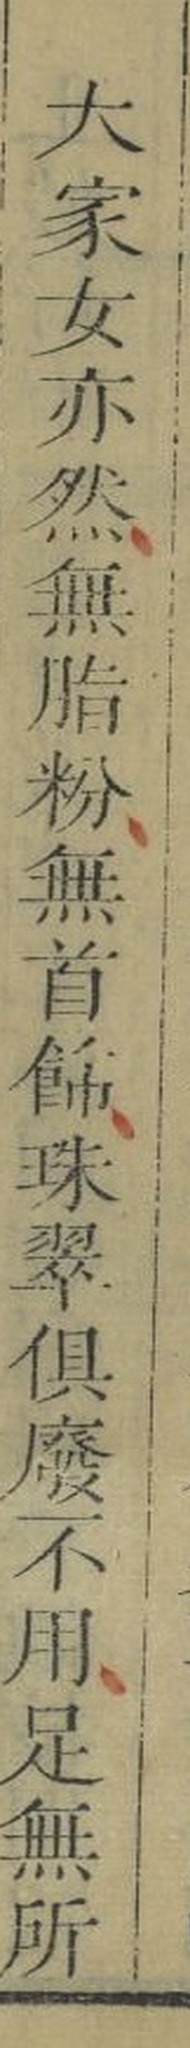大家女亦然無脂粉無首飾珠翠倶廃不用足無所
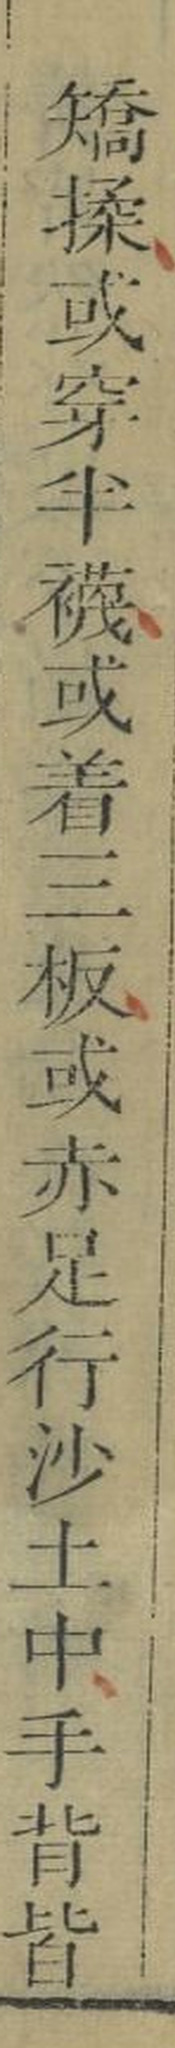矯揉或穿半襪或着三板或赤足行沙土中手背皆
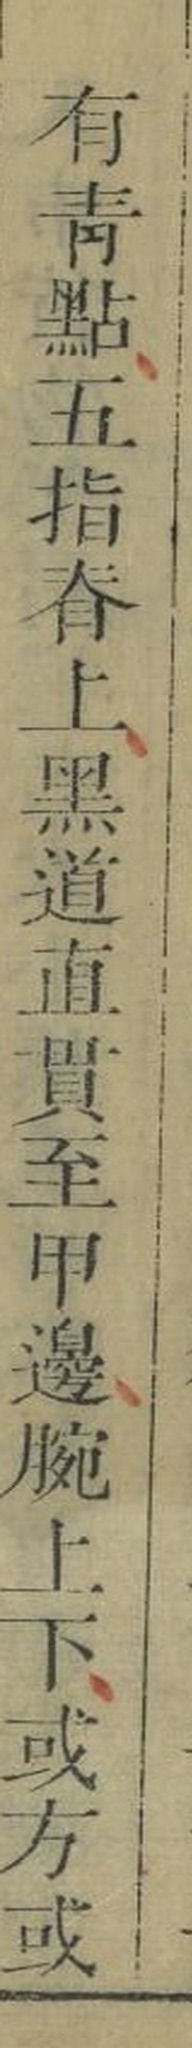有青点五指脊上黒道直貫至甲辺腕上下或方或
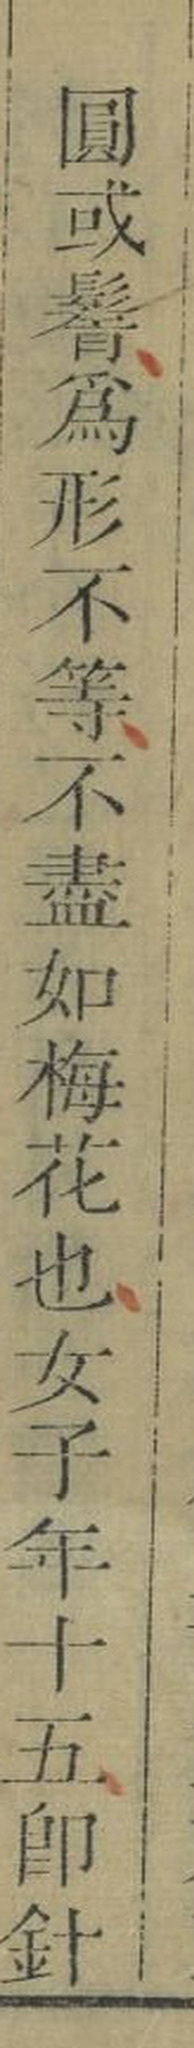円或鬌為形不等不尽如梅花也女子年十五即針
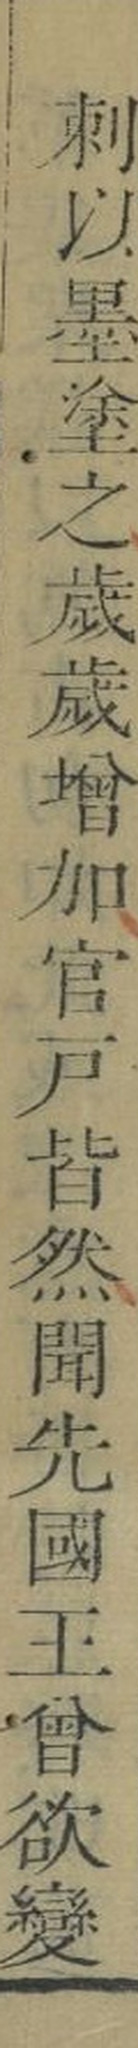刺以墨塗之歳歳増加官戸皆然聞先国王曽欲変

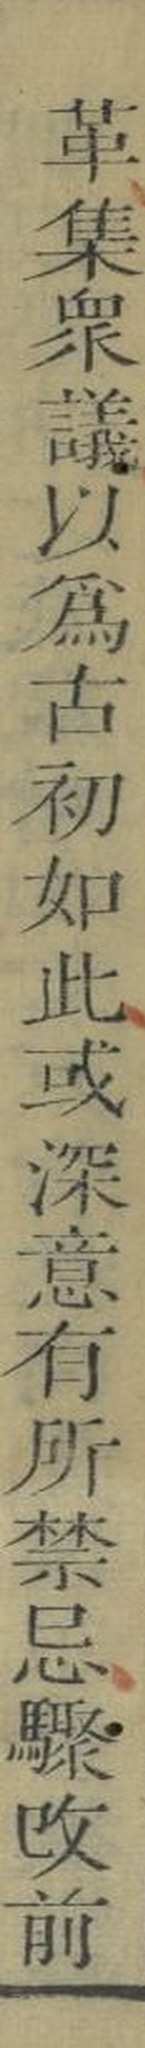革集衆議以為古初如此或深意有所禁忌驟改前
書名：中山伝信録 巻六
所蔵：University of the Ryukyus Library
